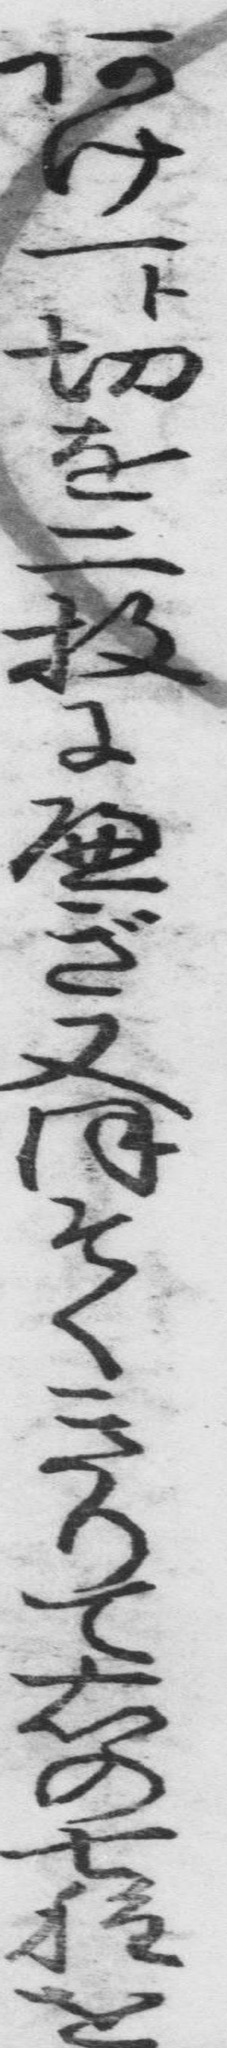阿け一ト切を二枚尓扁ぎ又保そくきりて右の七種を
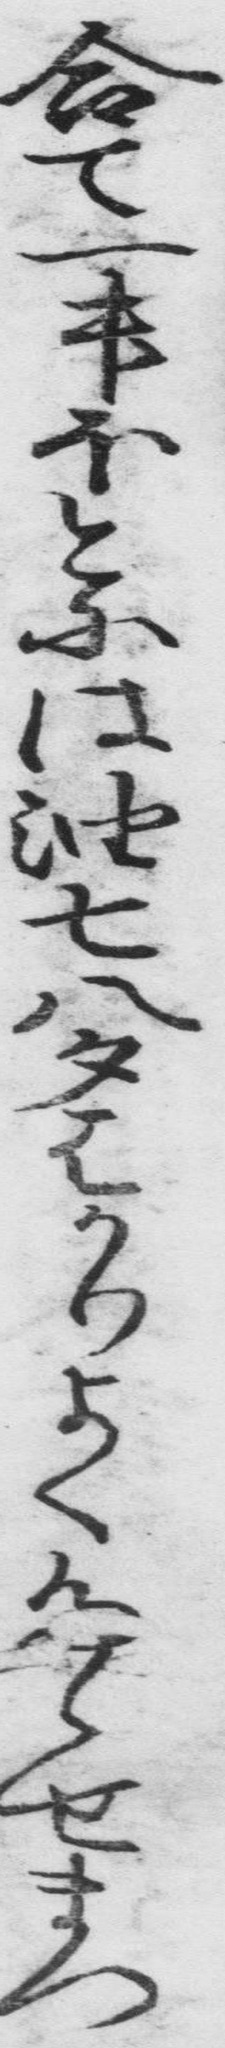合て一升不と尓は油七八勺はかりよく多々せまつ
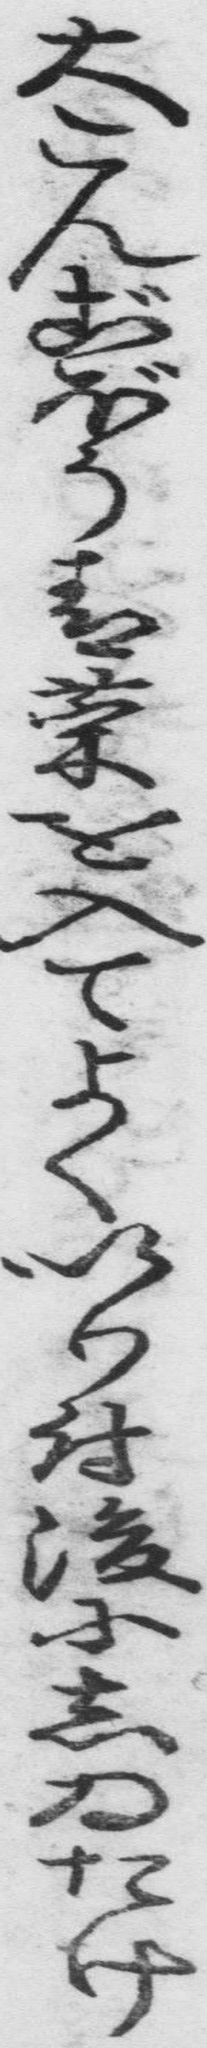大こんごぼう青菜を入てよく以り付後尓志ゐたけ
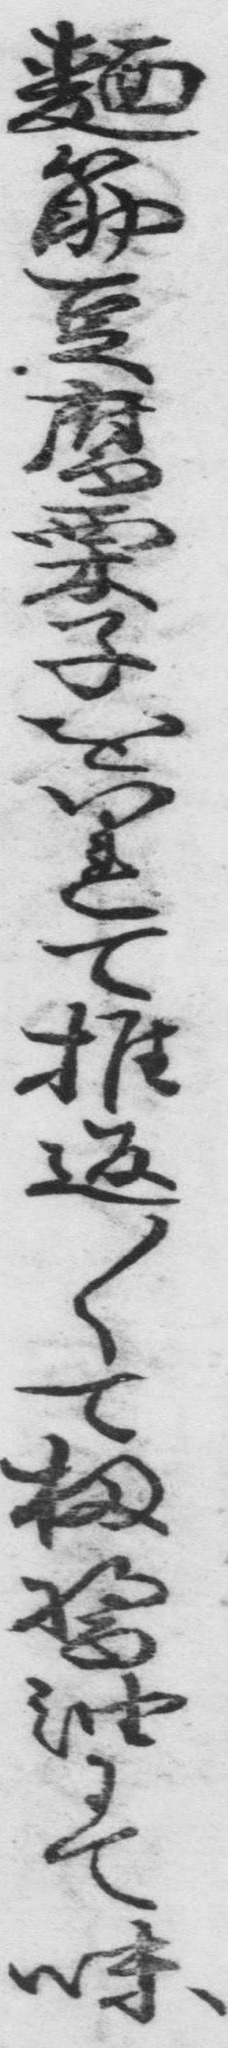麺筋豆腐栗子をい連て推返〳〵て扨醤油尓て味
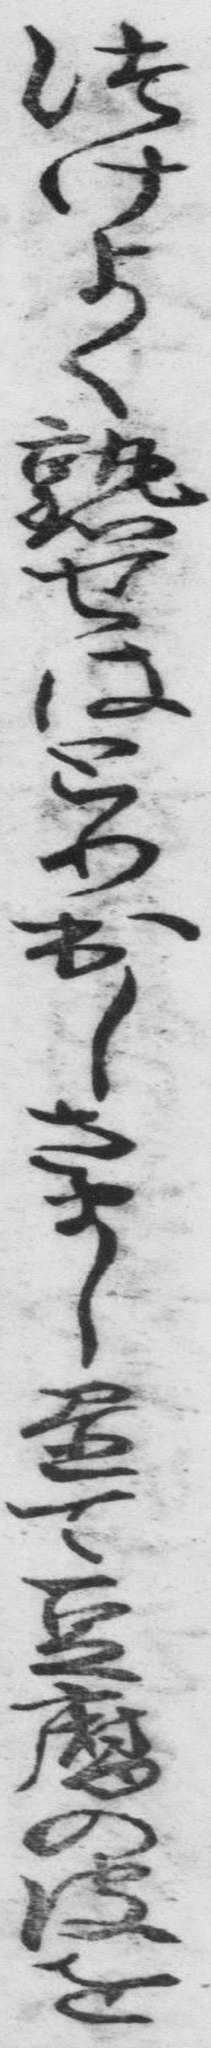徒けよく熟せはとり出しさまし置て豆腐の皮を

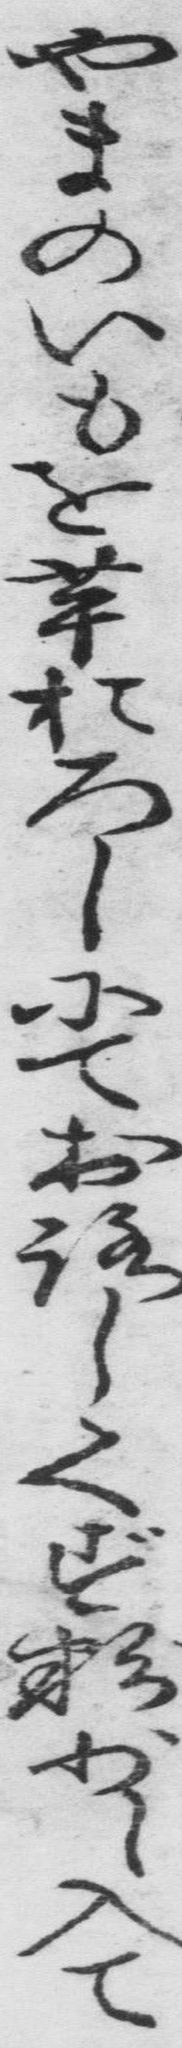やまのいもを芋於ろし尓てお路しくず粉少し入て
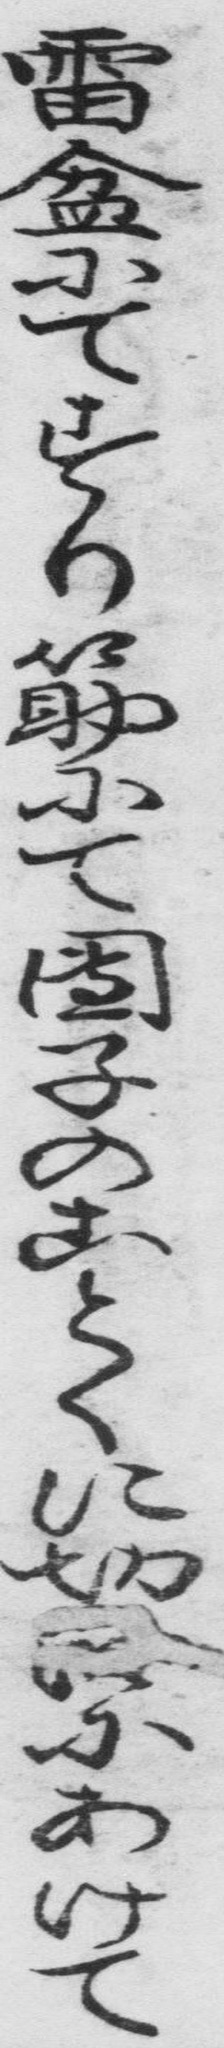雷盆尓て春り筋尓て団子の古とくに切油尓あけて
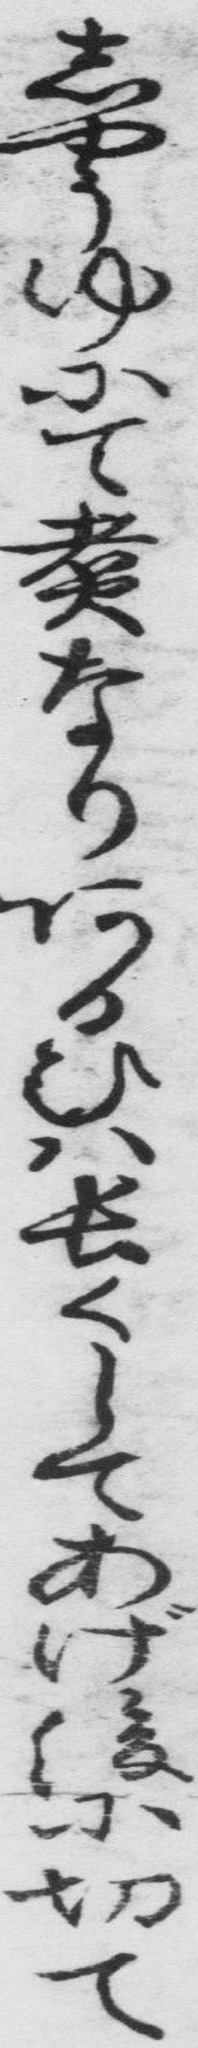志やうゆ尓て煮なり阿るひは長くしてあげ後尓切て
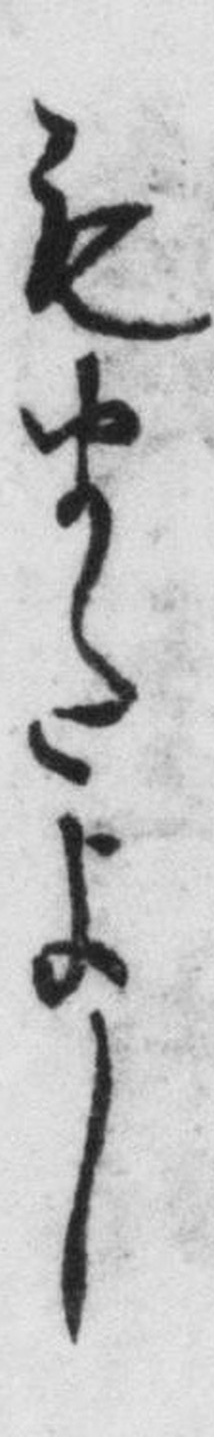もまたよし
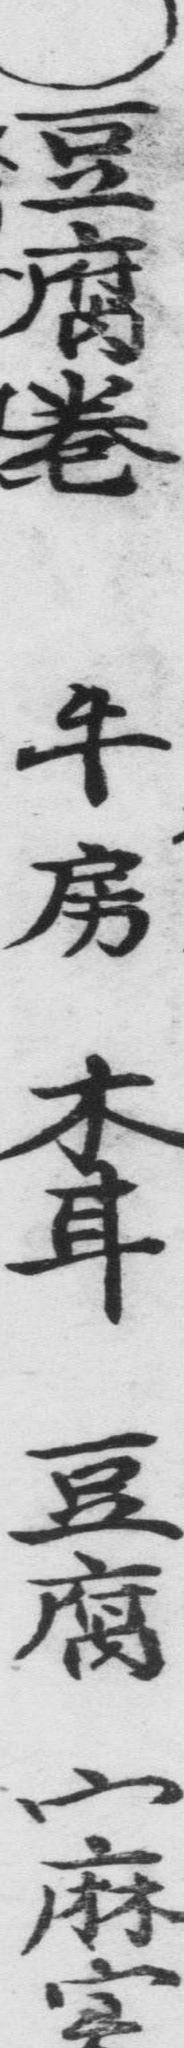◯豆腐巻牛房木耳豆腐麻実
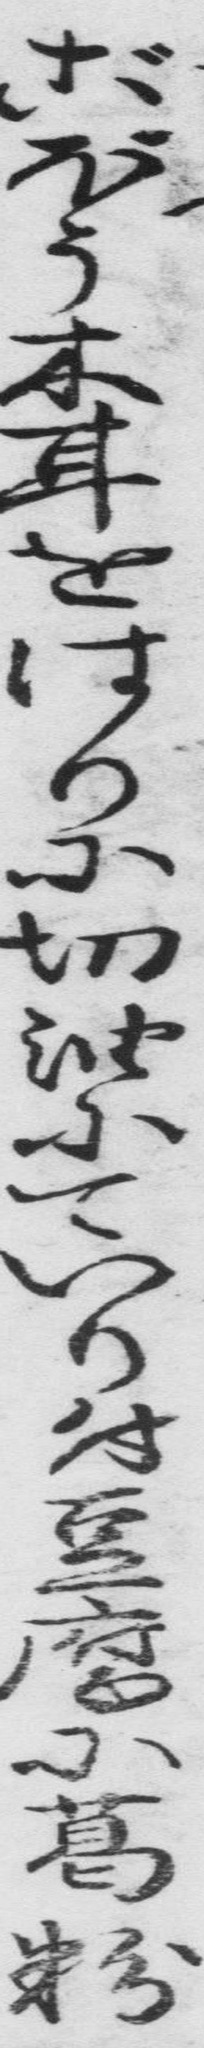ごぼう木耳をはり尓切油尓ていり付豆腐尓葛粉
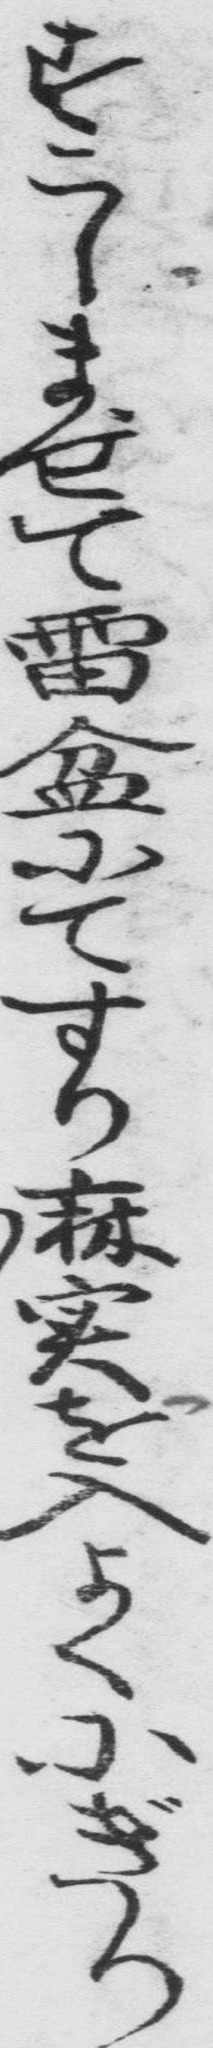春こしまぜて雷盆尓てすり朝麻実を入よく尓ぎり
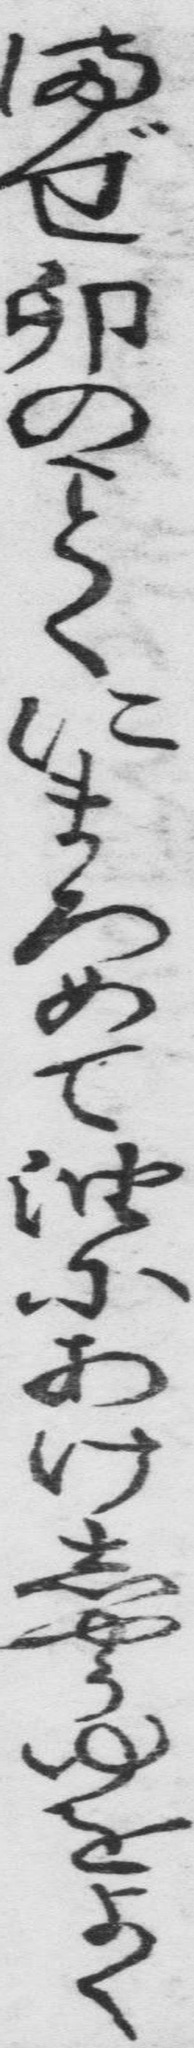満ぜ卵のことくにまろめて油尓あけ志やうゆをよく
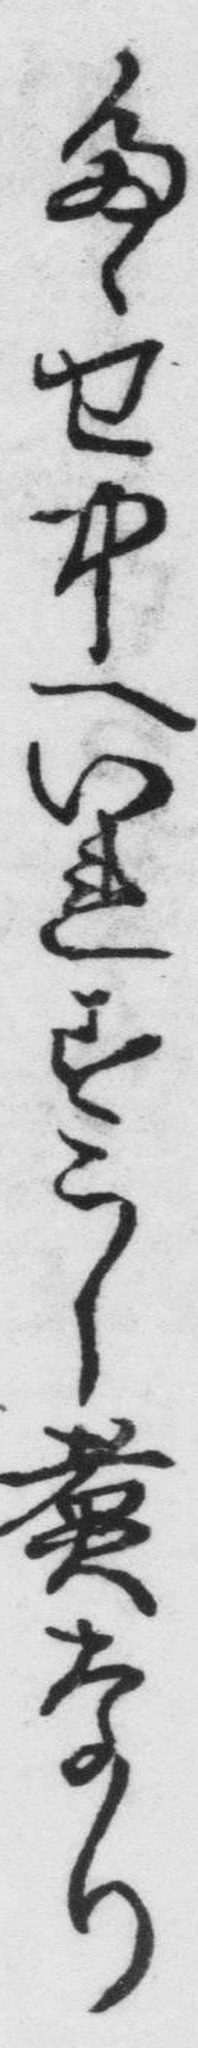多々せ中へい連春こし煮なり
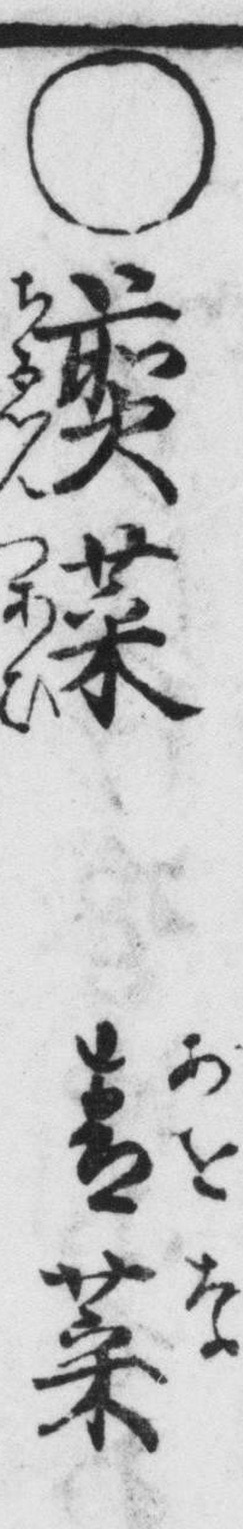◯煎菜青菜
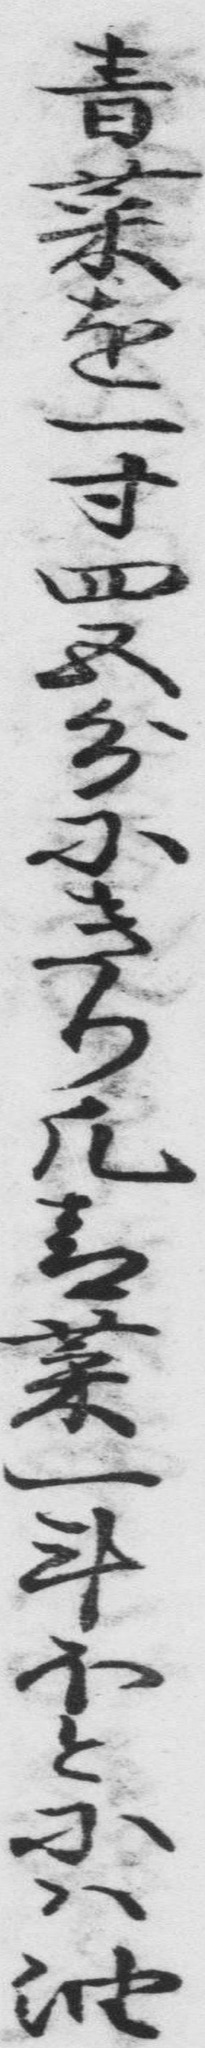青菜を一寸四五分尓きり凡青菜一斗ふと尓は油
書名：普茶料理抄
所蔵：大阪府立大学学術情報センター 国文学研究資料館
